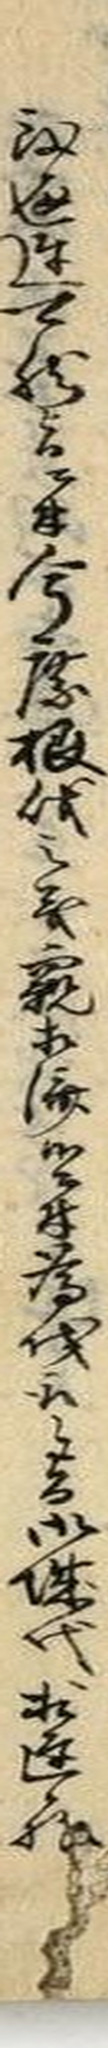致通達可然旨に付今度根伐之義窺相済候に付為伐取候旨御城代へ相達候様
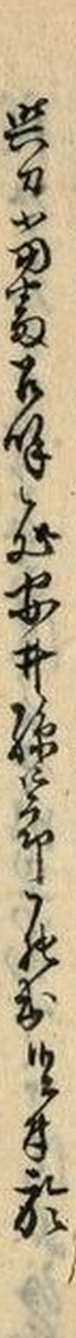与力当番召呼候処安井孫四郎罷出候に付於
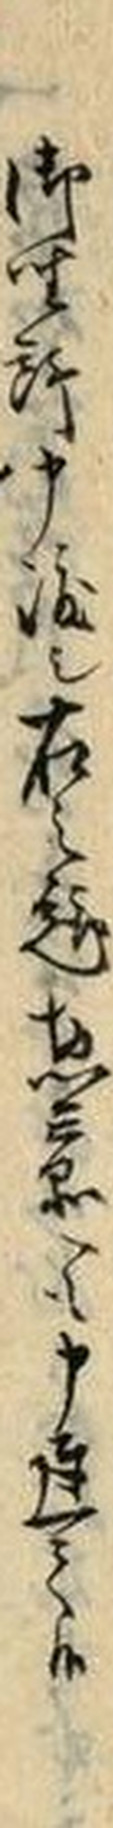御坐所申渡シ右之趣惣兵衛へも申達之候

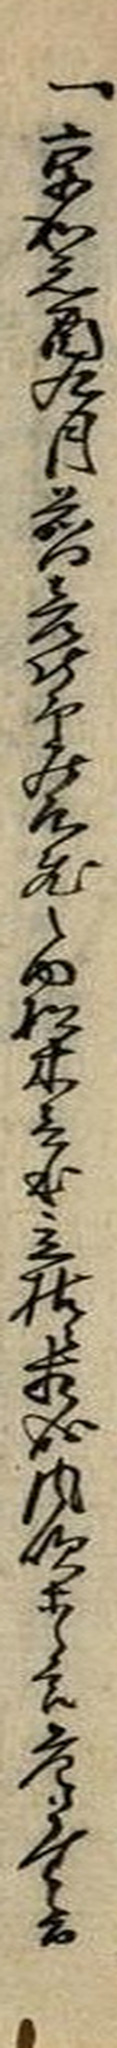一享和元酉九月前田彦次郎居屋敷之内松木壱本立枯に相成風吹等之節危御座候間
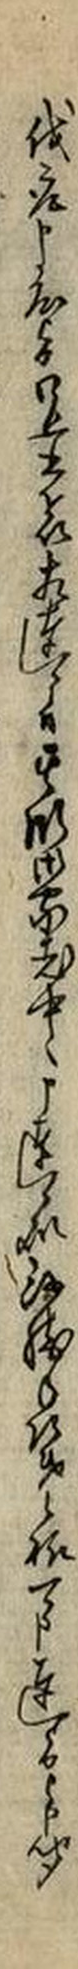伐取申度旨口上書を以相達候に付其段御家老中へ申達候処致勝手次第之様可申達旨被申聞
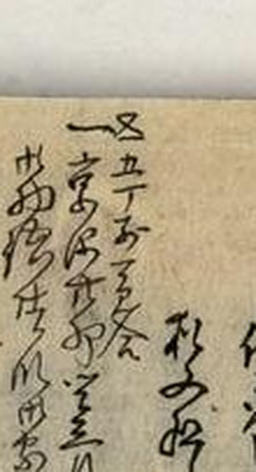五丁前可見合
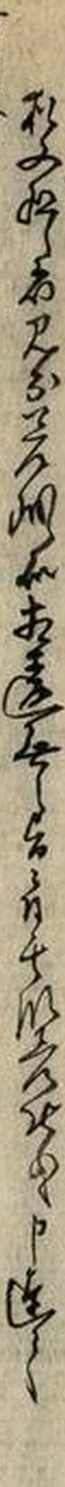猶又組之者見分差越候処相違無之旨に付其段彦次郎申達之
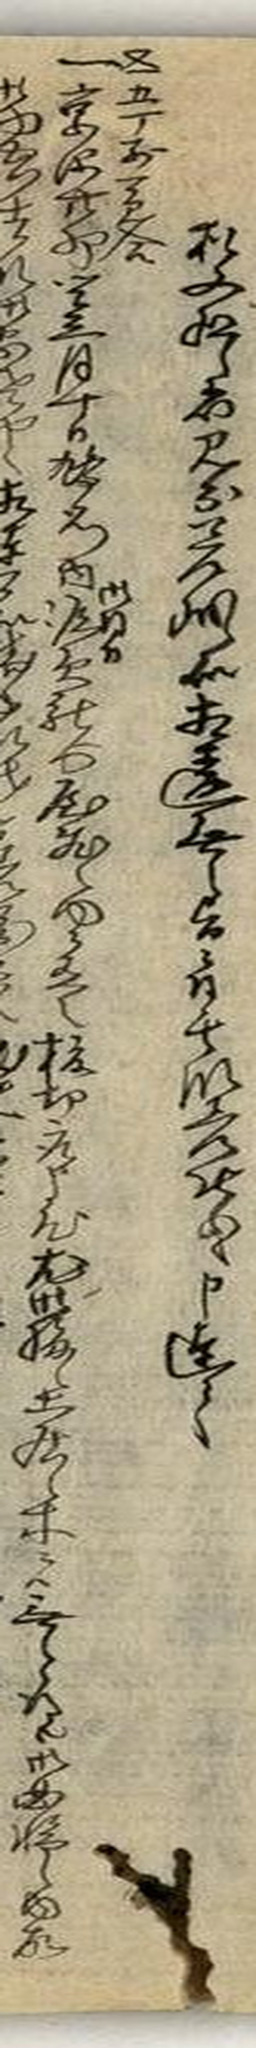一享保廿卯閏三月十日鳩御門内御目付渥美新右衛門屋敷之内に有之榎切取申度尤御脇之土居之木には無之候得共御曲輪之内故
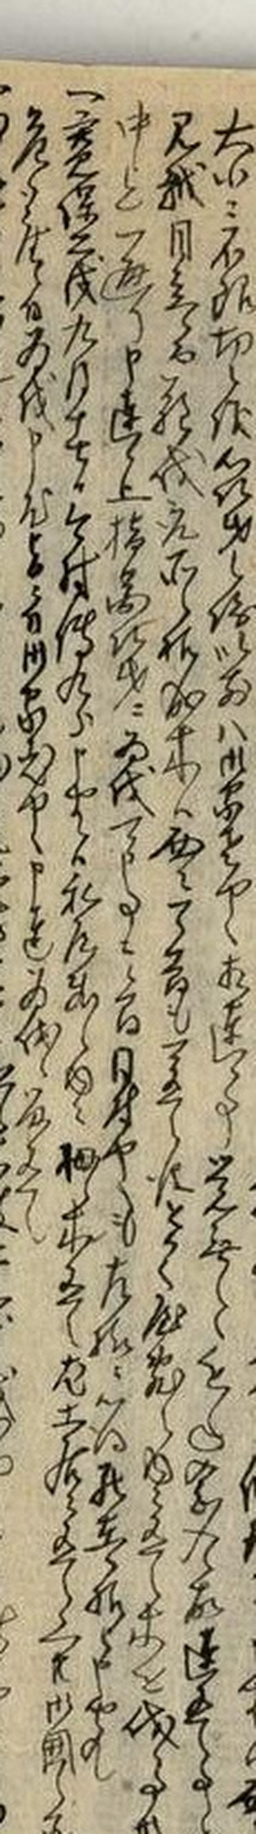中迄一通り申達候上指図次第に為伐可申事に候間目付中へも左様に心得罷在候様被申聞候
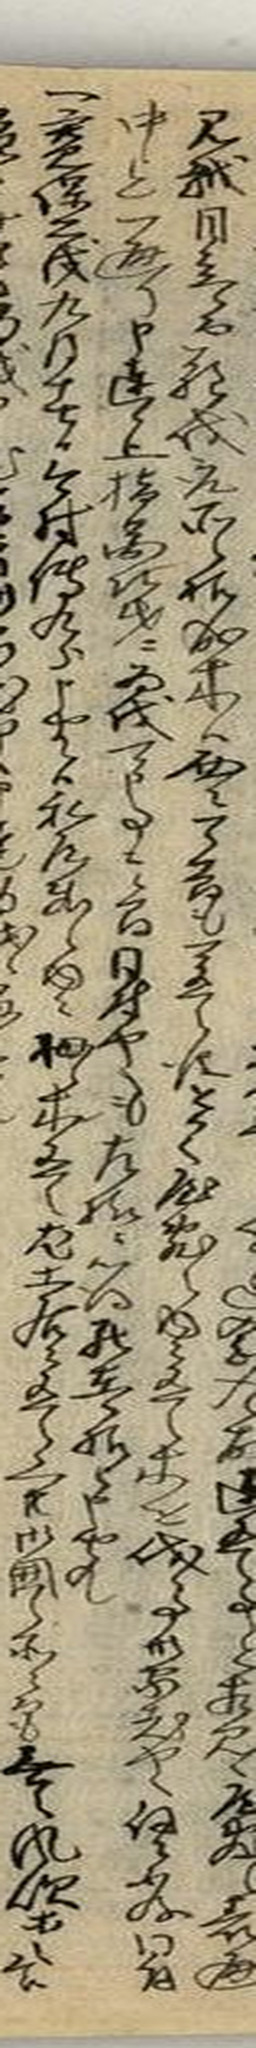一寛保二戌九月十七日今村伝九郎申聞候は私屋敷之内に栂之木有之尤土居に有之候へ共御囲之所にても無之風吹等之節
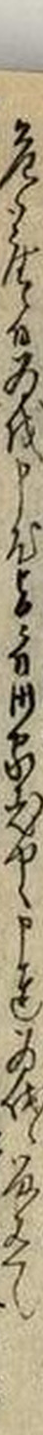危御座候に付為伐申度旨に付御家老中へ申達為伐候留有之
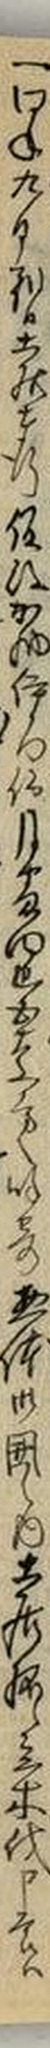一同年九月朔日土居奉行仮役加納伊右衛門儀月番田辺五大夫方へ呼寄惣体御囲之内土居抔之立木伐申節は
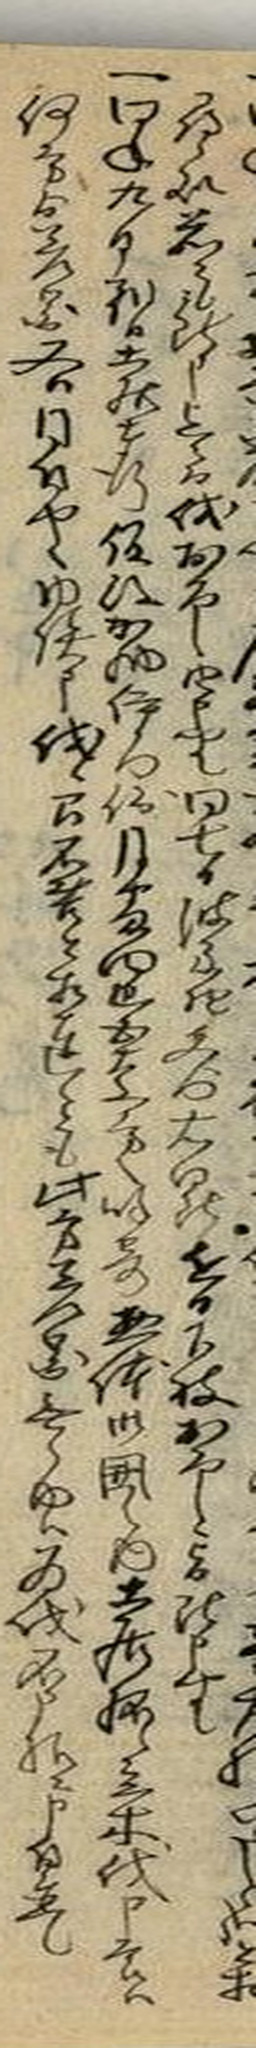何方ゟ差図又は目付中へ内談申伐候間不苦と相達候とも此方差図無之内は為伐不申様に申付置候

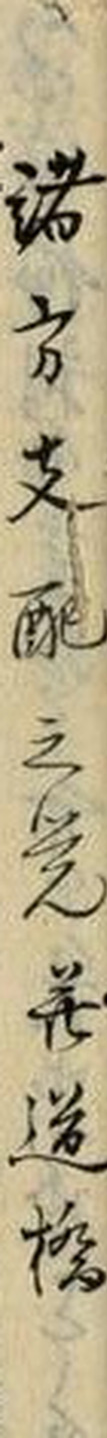諸方支配之覚并道橋
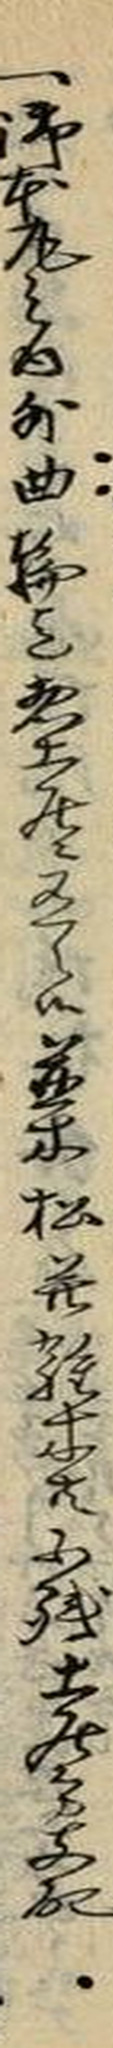一御本丸之内外曲輪迄惣土居ニ有之候並木松并雑木共不残土居方支配
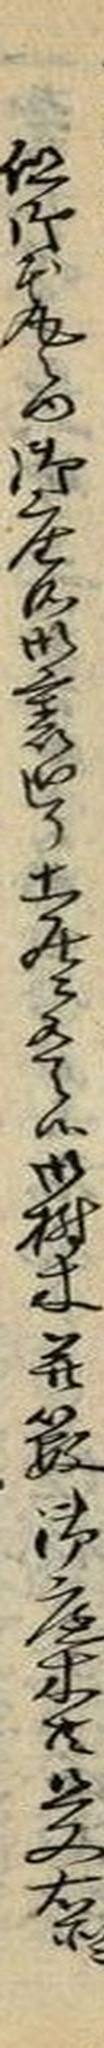但御本丸之内御座所御裏廻り土居ニ有之候御樹木并薮御庭木共且又右所ニ
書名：御城下諸事之部
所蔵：福井県文書館 Fukui Prefectural Archives
